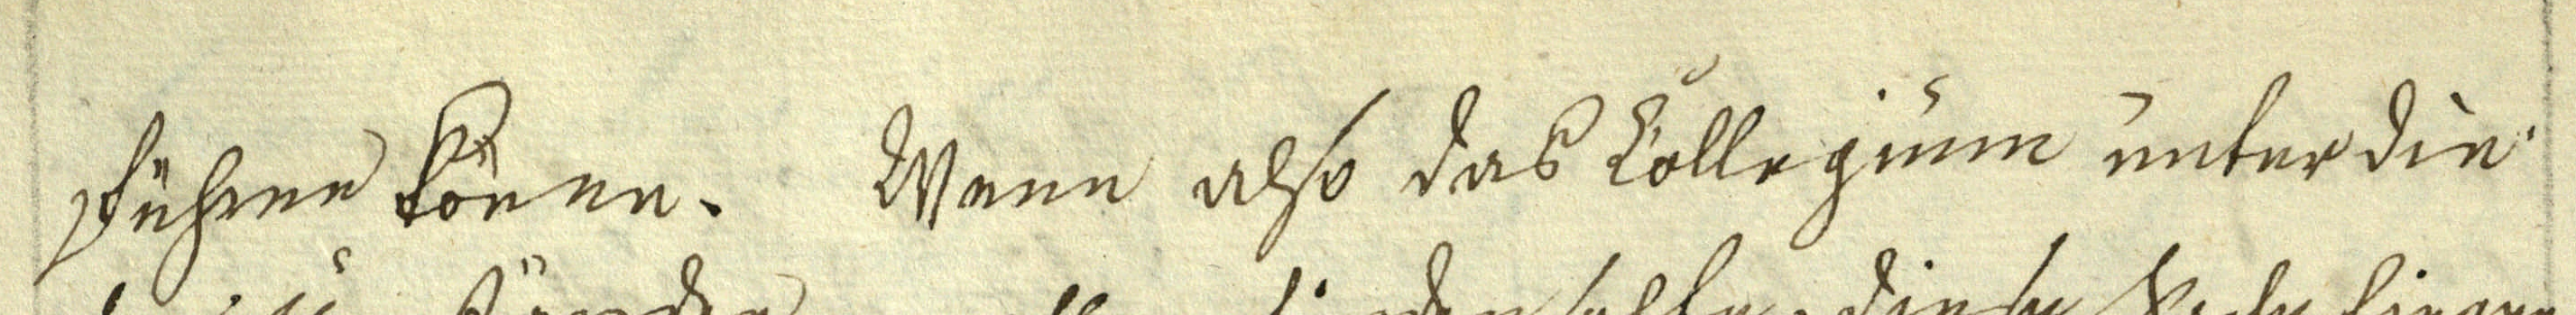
führen könne. Wenn also das Collegium unter die¬
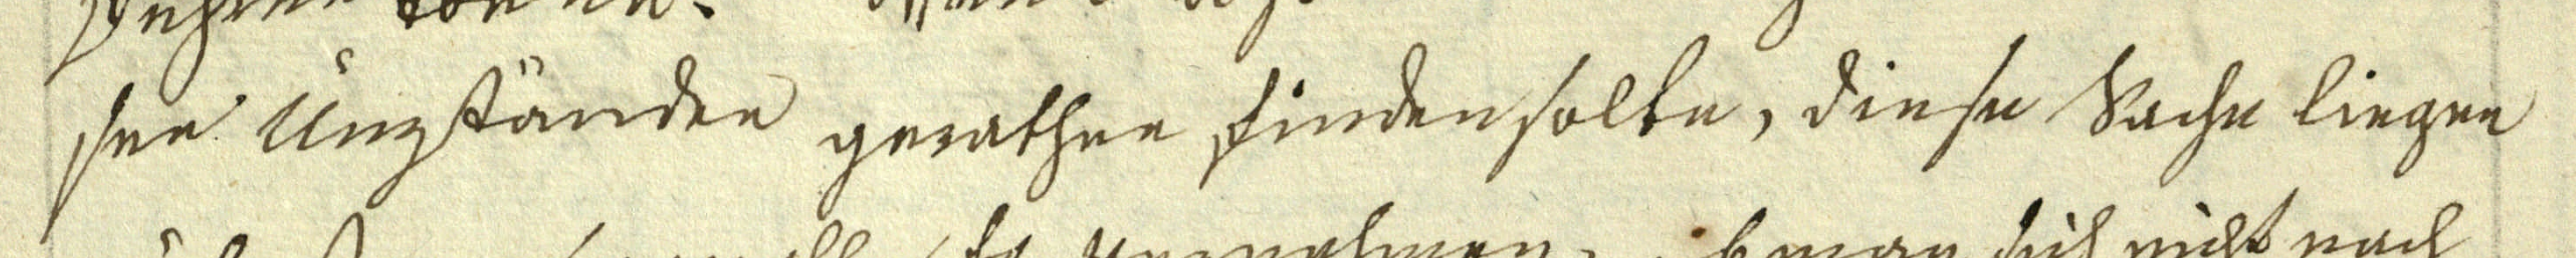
sen Umständen gerathen finden solte, diese Sache liegen
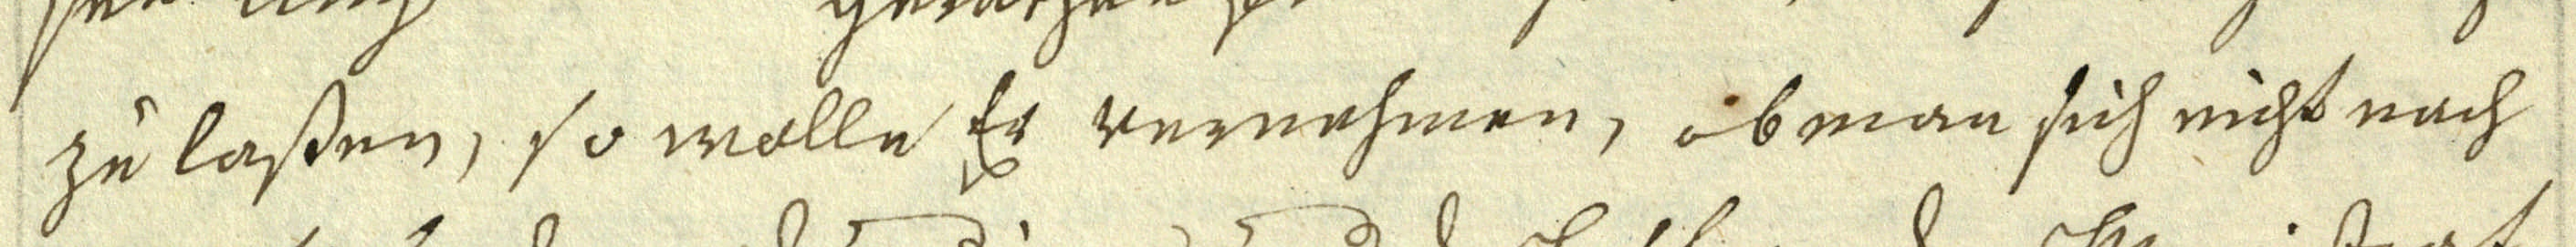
zu lassen, so wolle Er vernehmen, ob man sich nicht nach
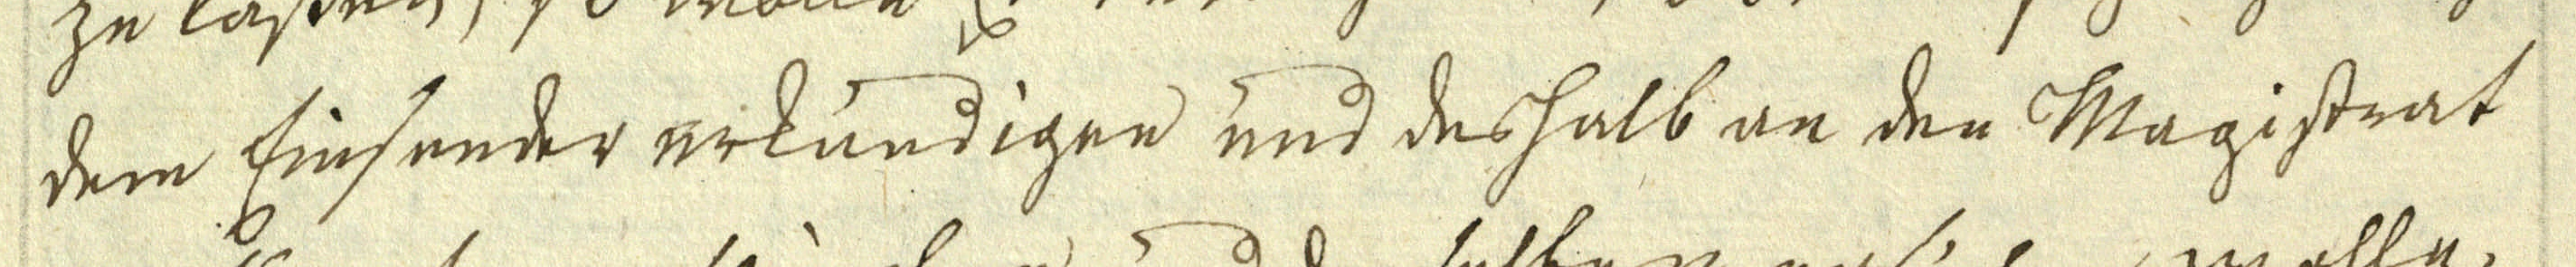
dem Einsender erkundigen und deshalb an den Magistrat
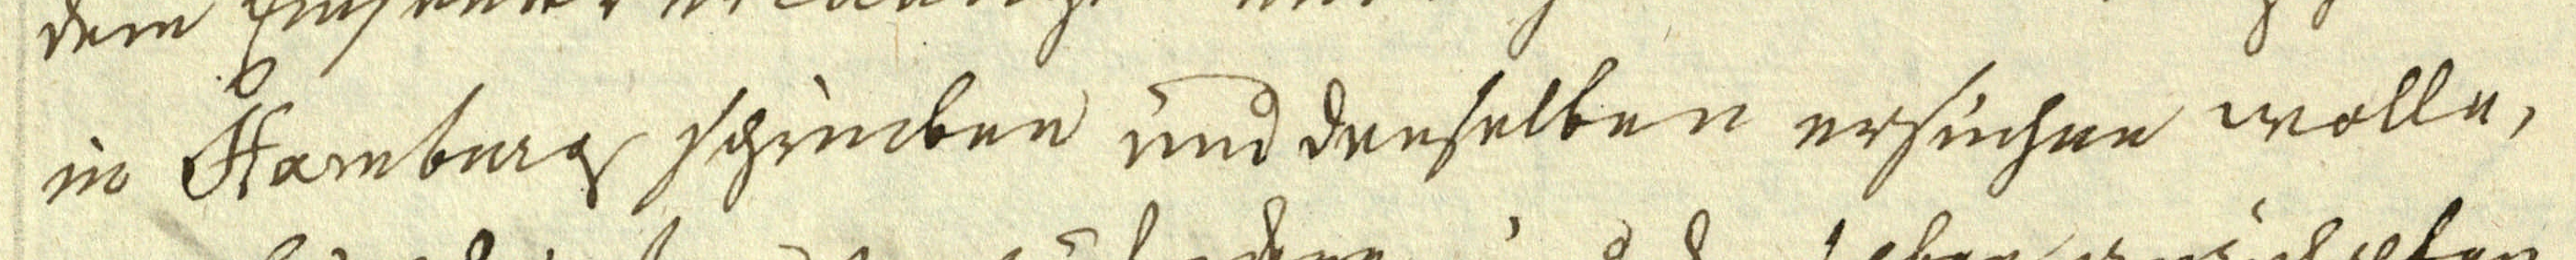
in Hamburg schreiben und denselben ersuchen wolle,
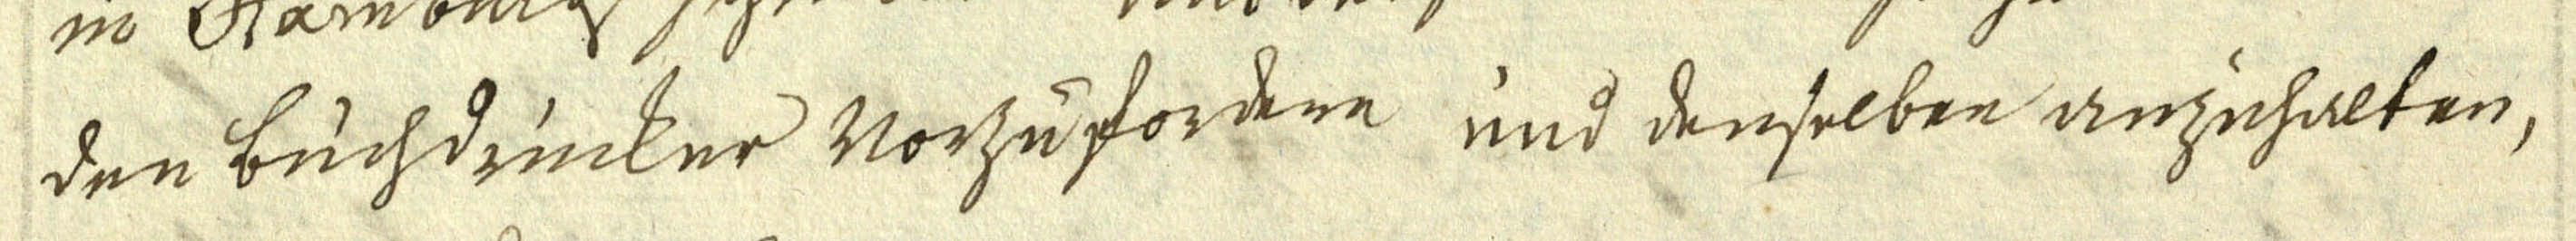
den Buchdrucker vorzufordern und denselben anzuhalten,
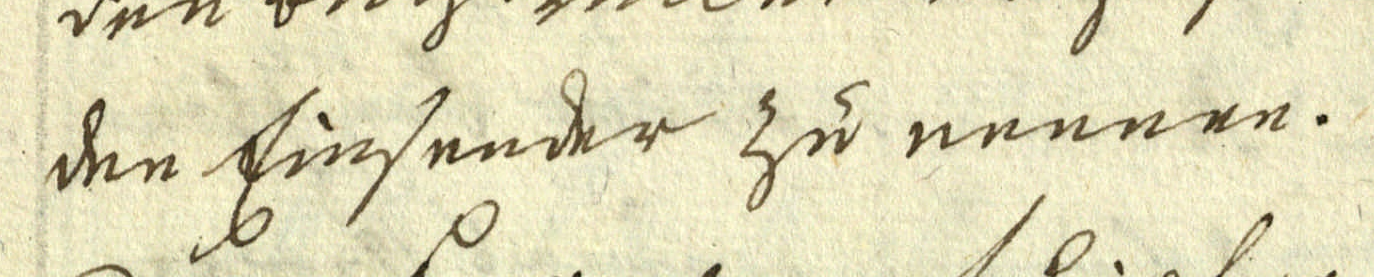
den Einsender zu nennen.
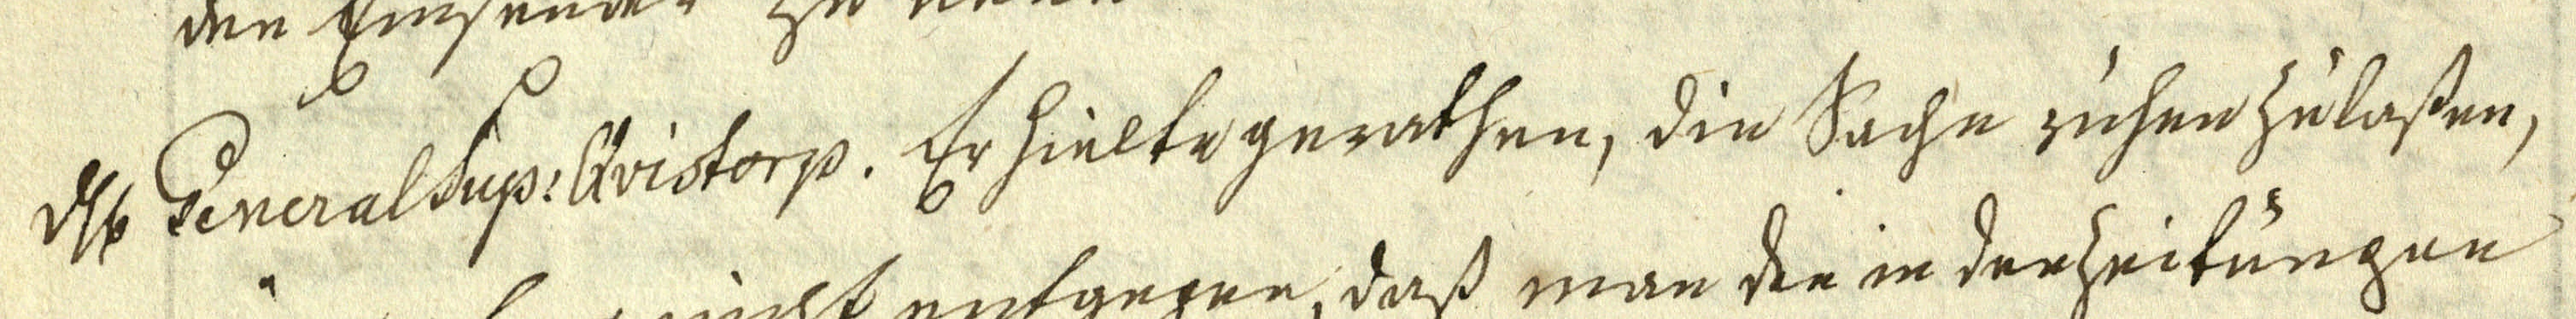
dh GeneralSup Quistorp. Er hielte gerathen, die Sache ziehen zulaßen,
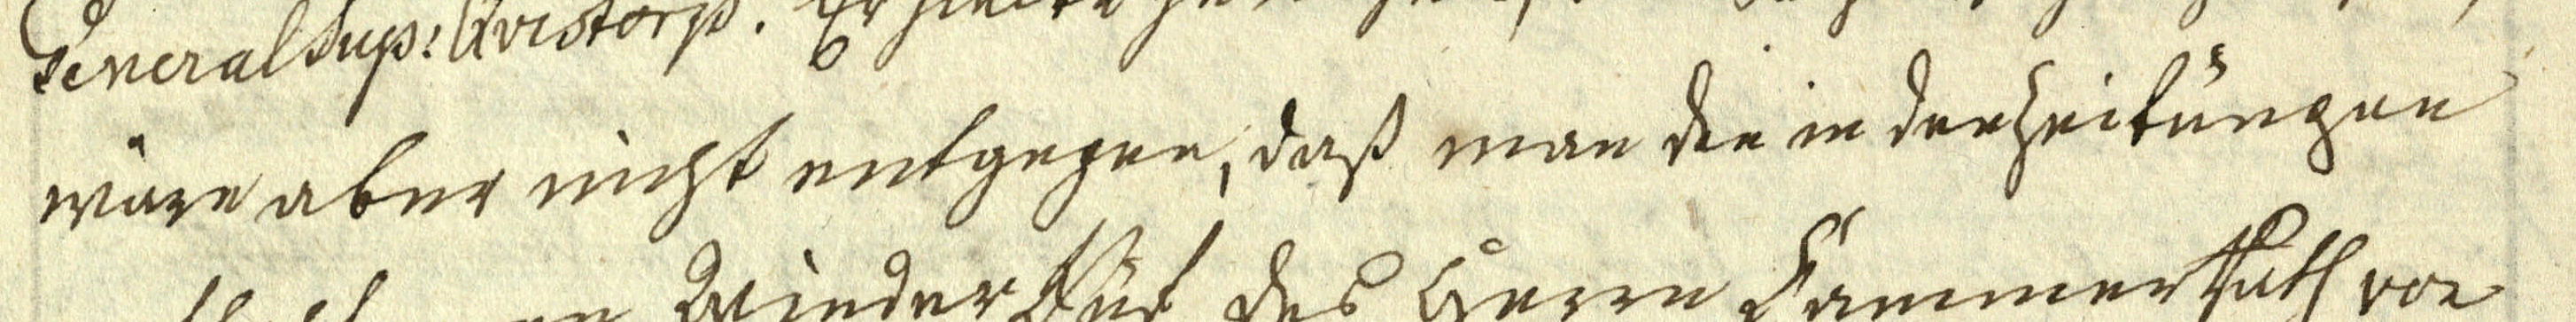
wäre aber nicht entgegen, daß man den in den Zeitungen
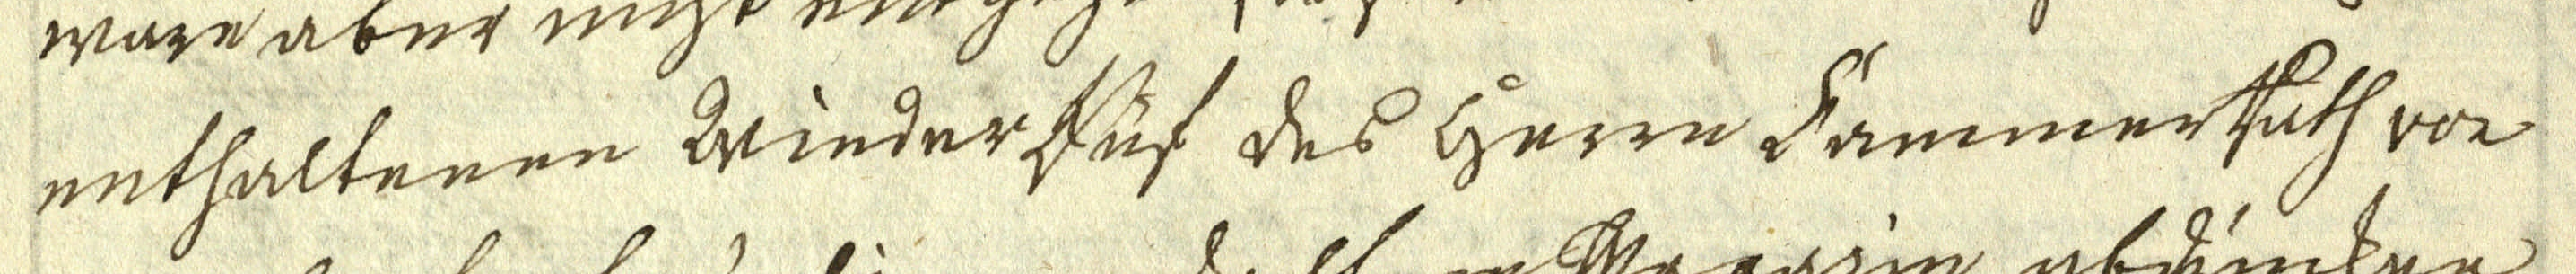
enthaltenen WiederRuf des Herrn CammerRath von
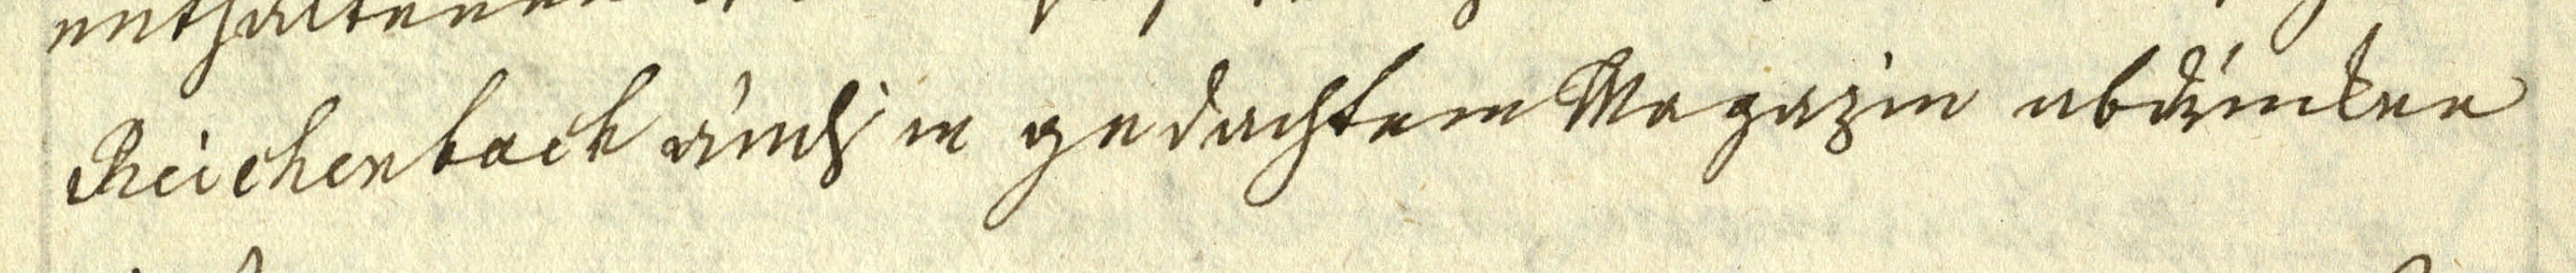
Reichenbach auch in gedachtem Magazin abdrucken
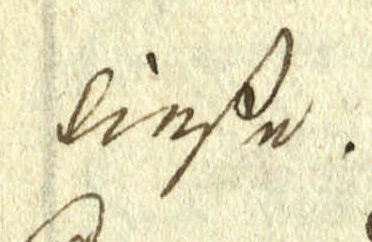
lie.ße
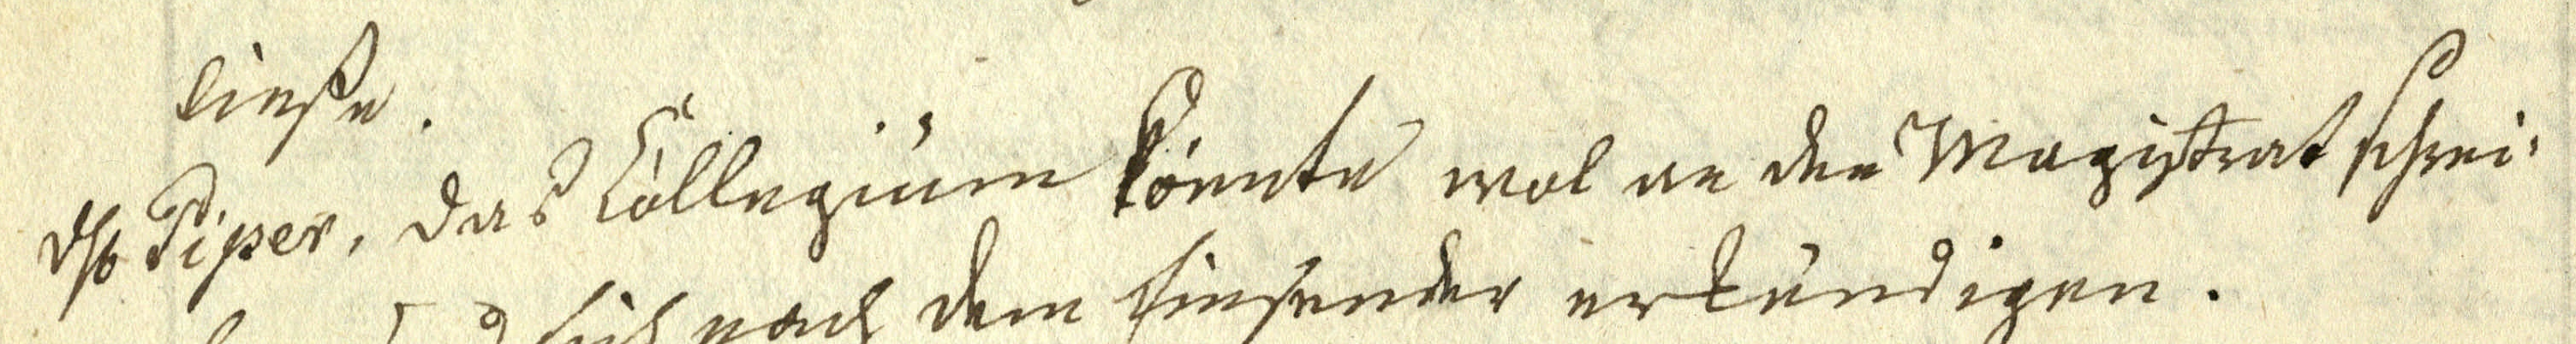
dh. Piper, Das Collegium könnte wol an den Magistrat schrei¬
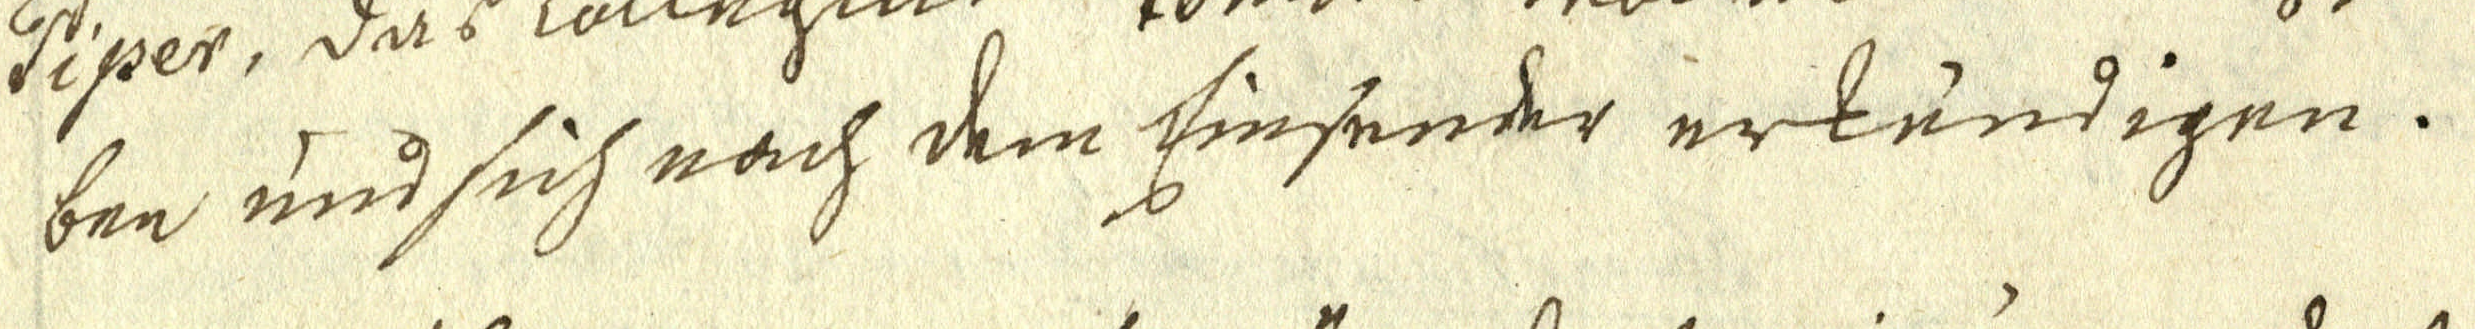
ben und sich nach dem Einsender erkundigen.
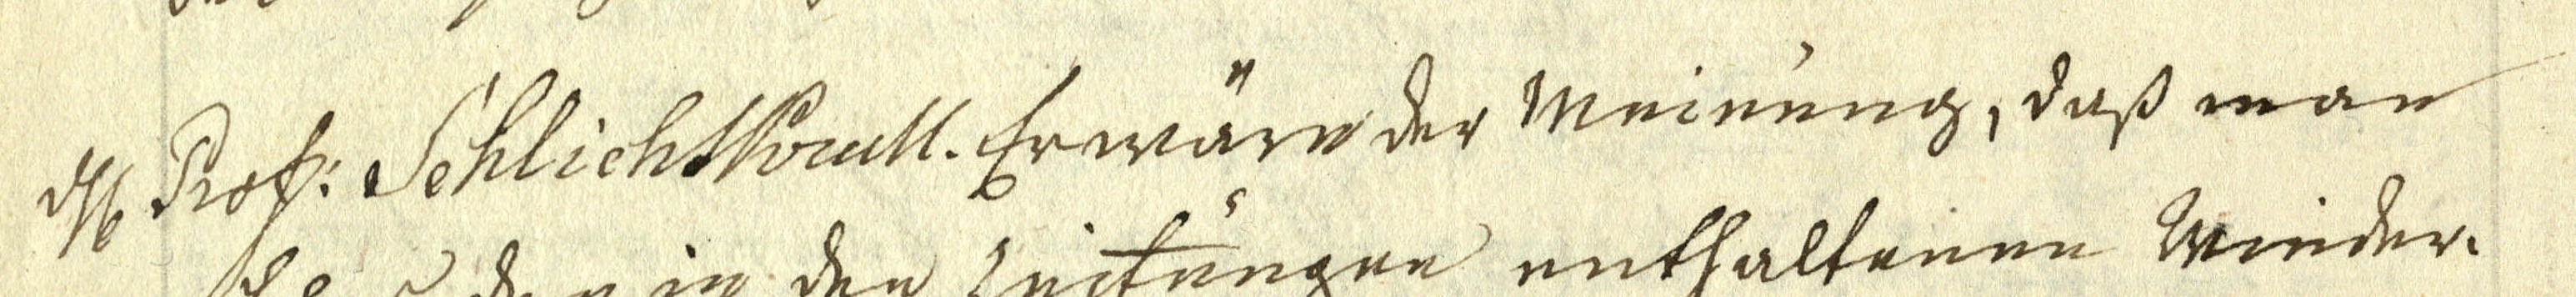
dh Prof. Schlichtkrull. Er wäre der Meinung, daß man
